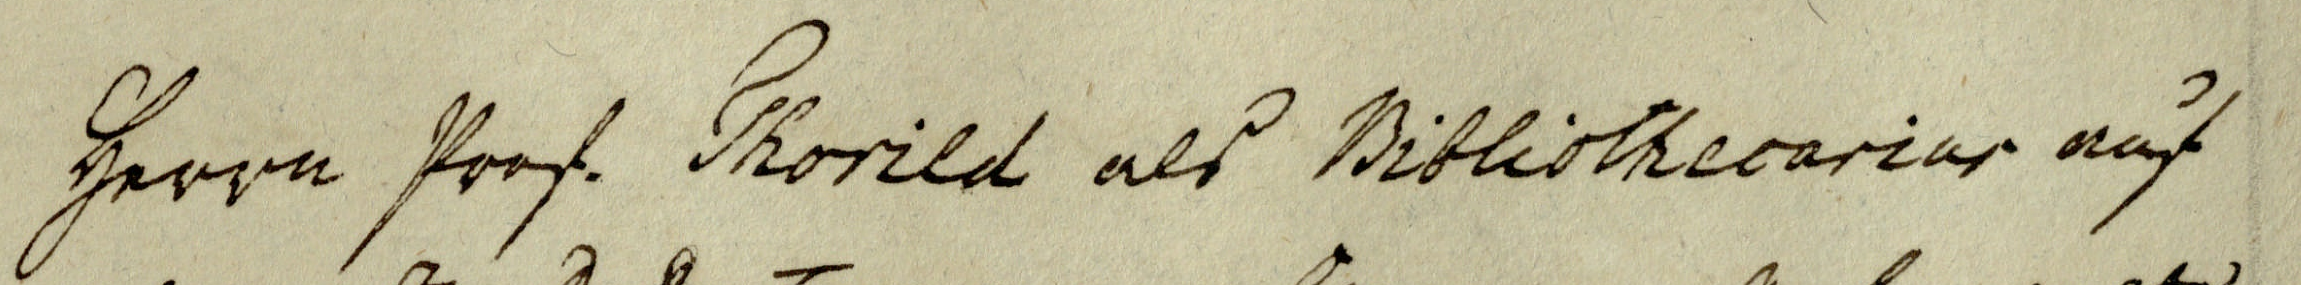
Herrn Prof. Thorild als Bibliothecarius auf
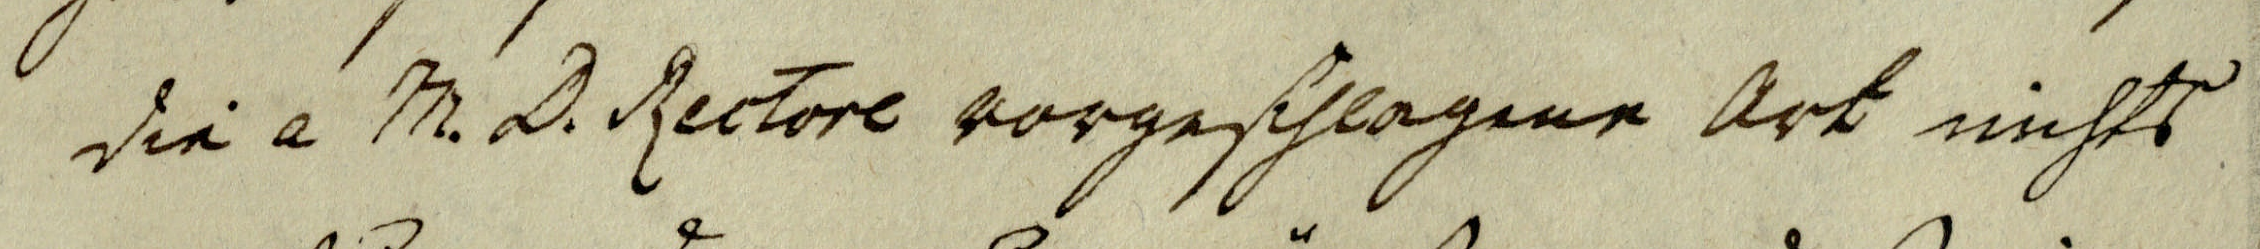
die a M. D. Rectore vorgeschlagene Art nichts
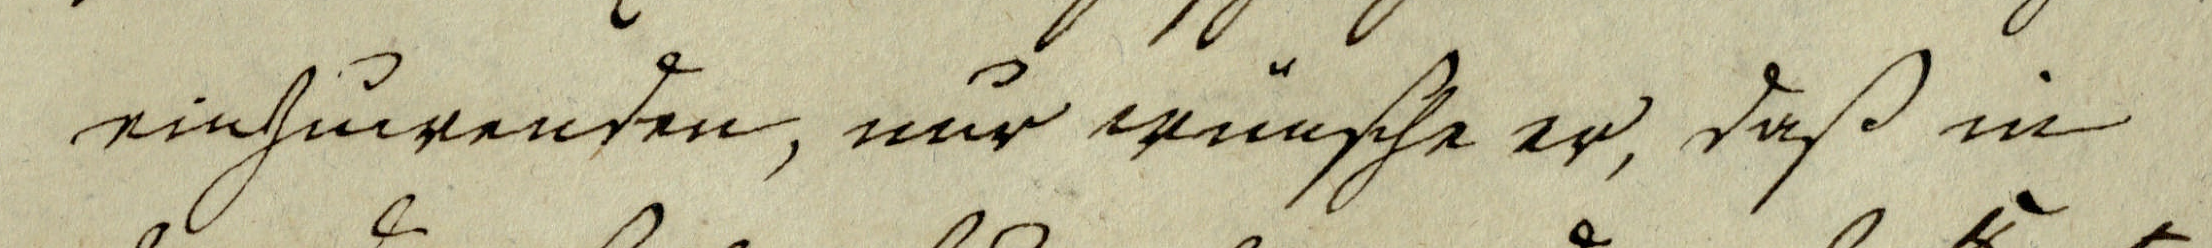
einzuwenden, nur wünsche er, daß in
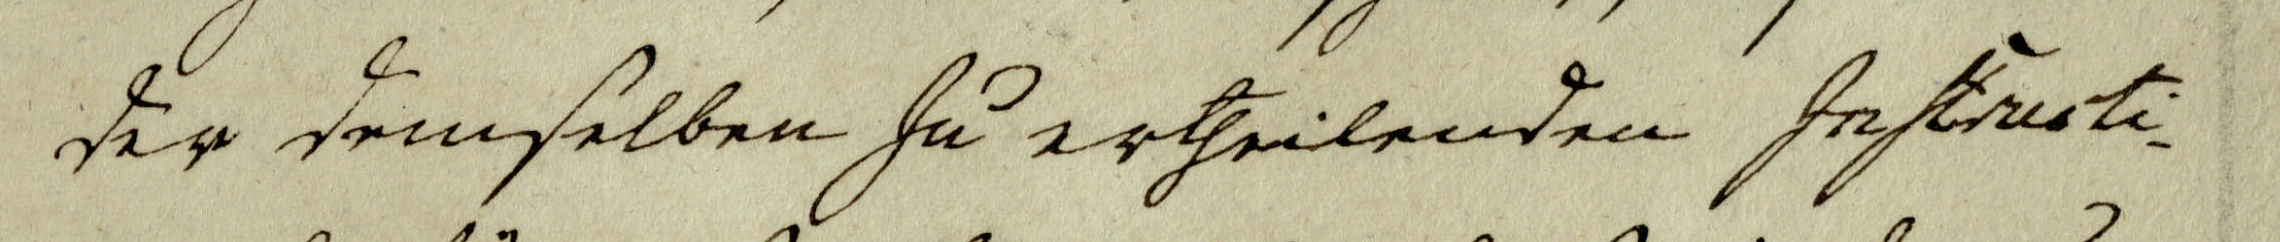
der demselben zu ertheilenden Instructi¬
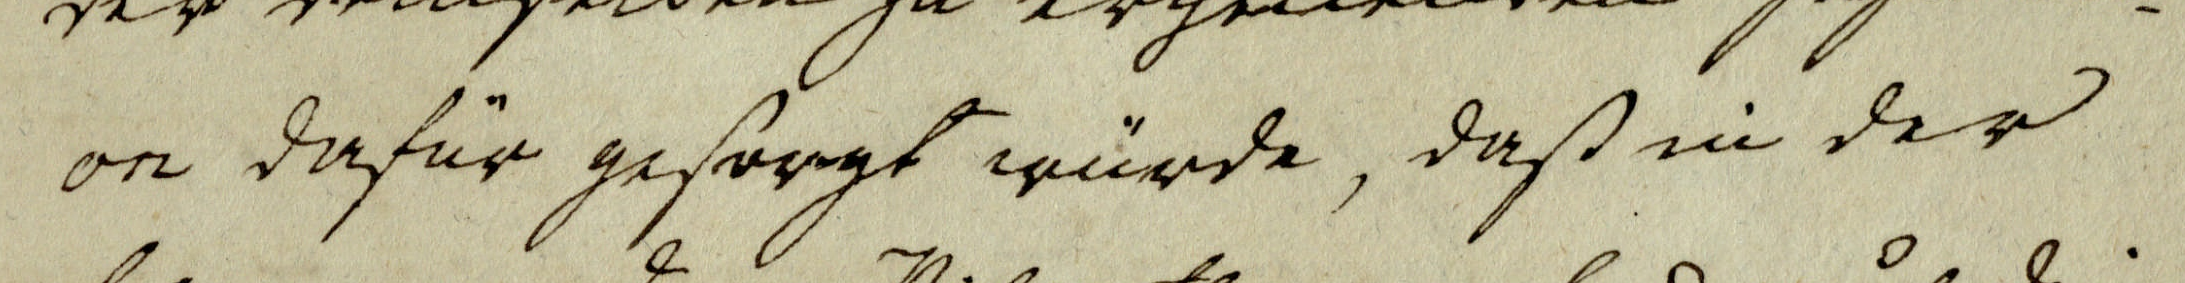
on dafür gesorgt würde, daß in der
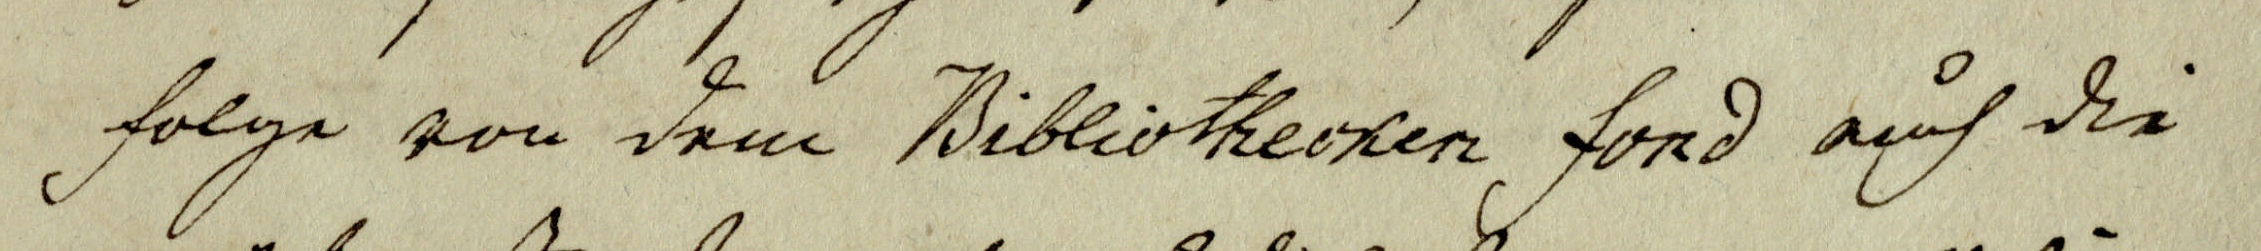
Folge von dem Bibliothecken Fond auch die
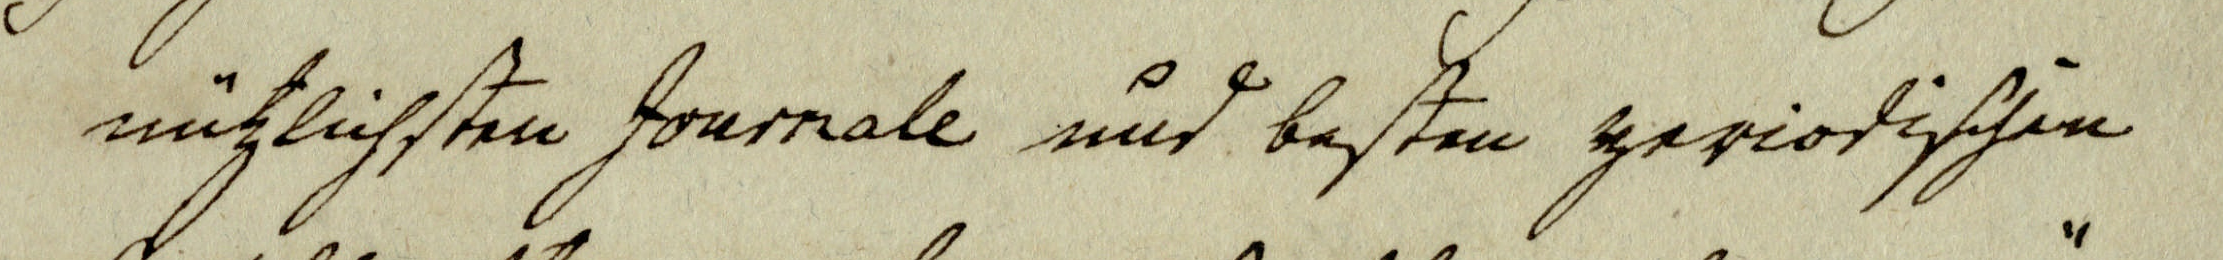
nützlichsten Journale und besten periodischen
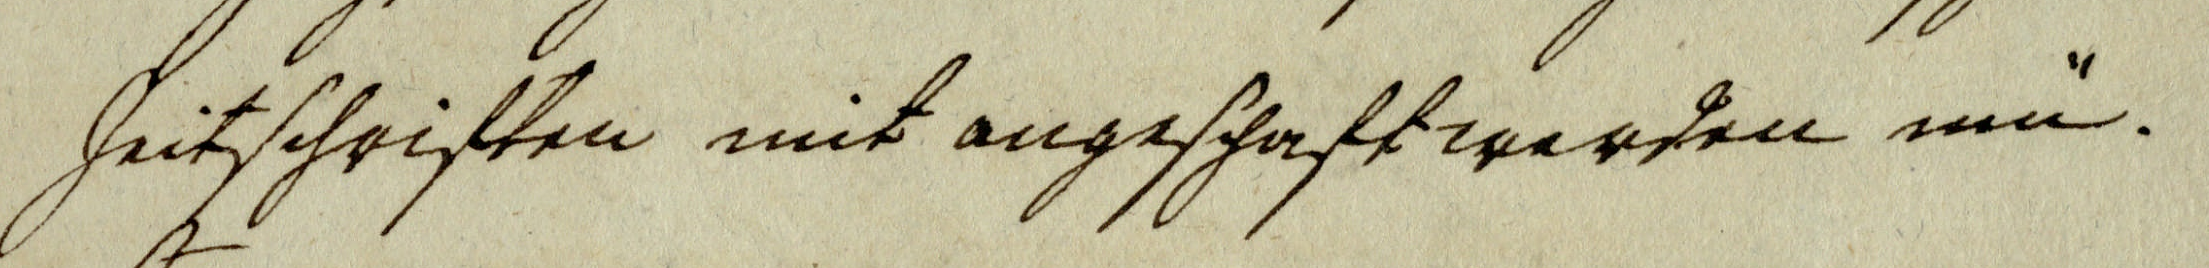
Zeitschriften mit angeschaft werden mü¬
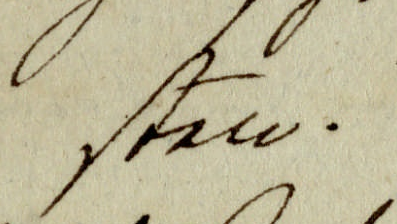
sten.
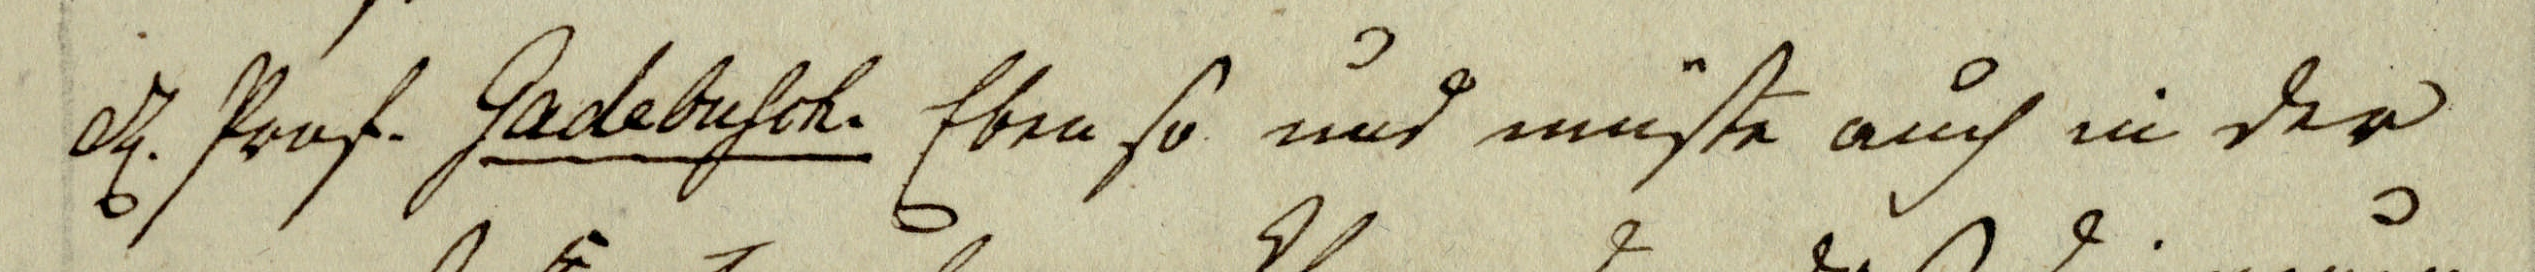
dh. Prof. Gadebusch. Eben so und müßte auch in der
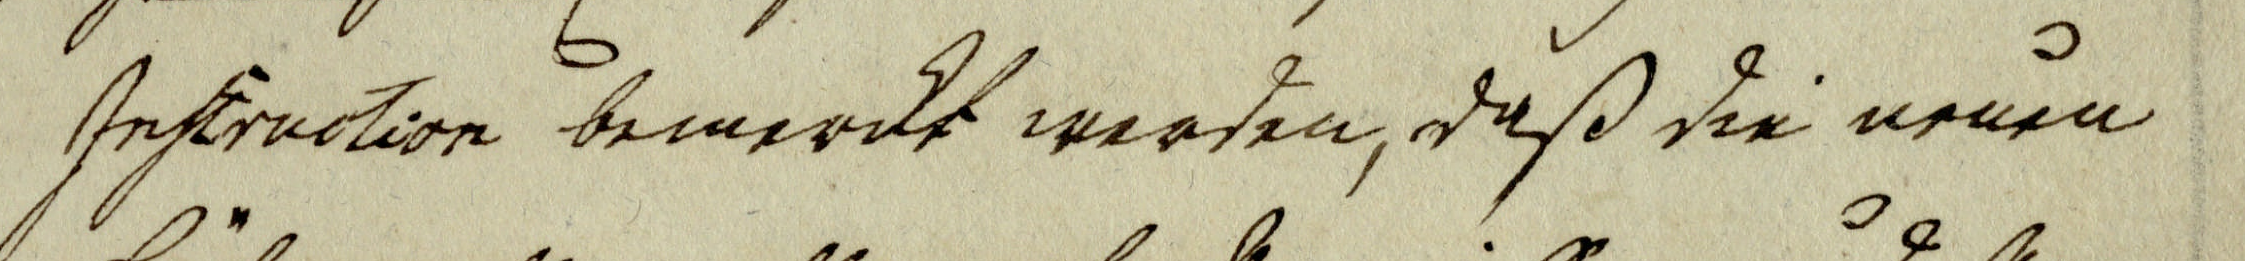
Instruction bemerckt werden, daß die neuen
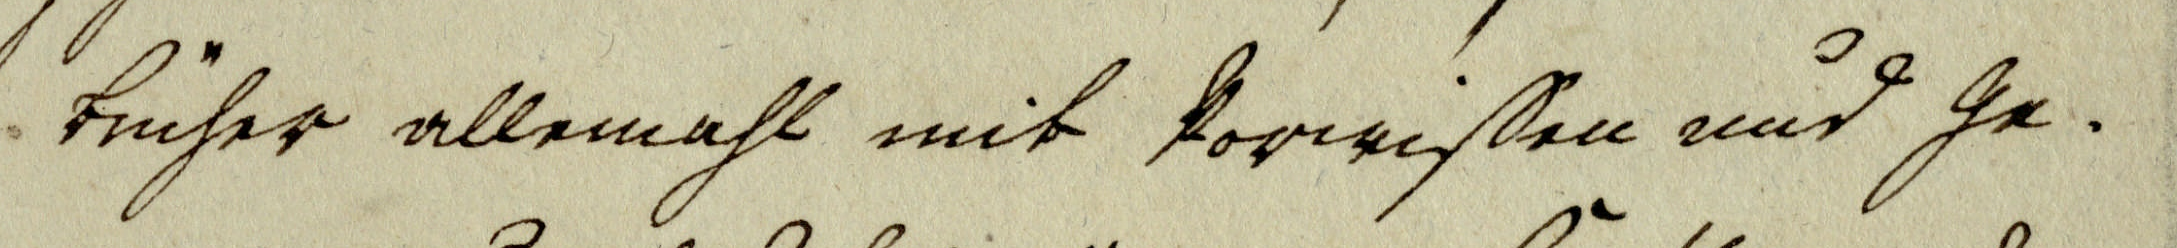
Bücher allemahl mit Vorwissen und Ge¬
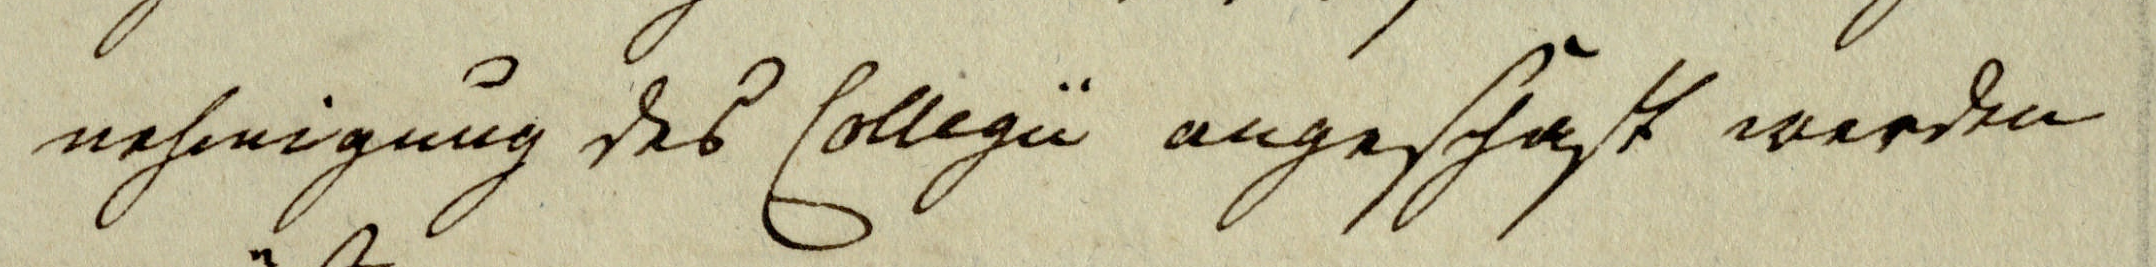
nehmigung des Collegii angeschaft werden
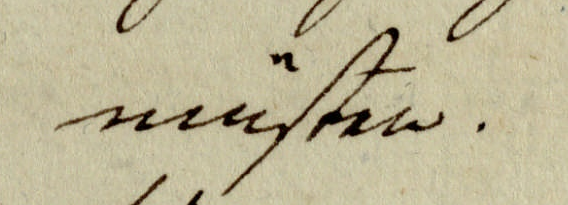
müßten.
